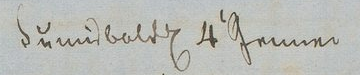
Summiswald den 4t Jenner
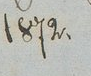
1872.
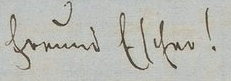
Freund Escher!
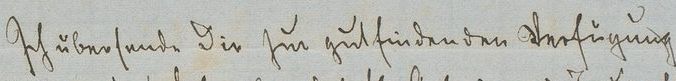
Ich übersende Dir zur gutfindenden Verfügung
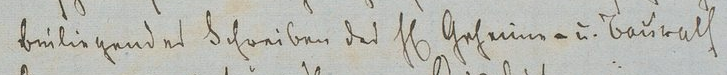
beiliegendes Schreiben das Herrn Geheim- u. Baurath
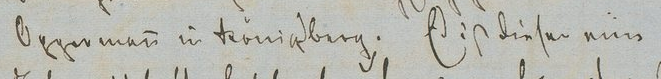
Oppermann in Königsberg. Es ist dieser eine
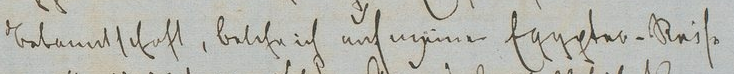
Bekanntschaft, welche ich auf meiner Egypten-Reise
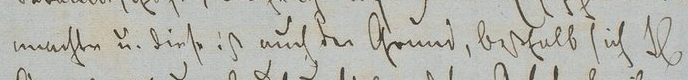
machte u. diese ist auch der Grund, weshalb sich H err
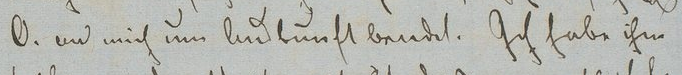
O. an mich um Auskunft wendet. Ich habe ihm
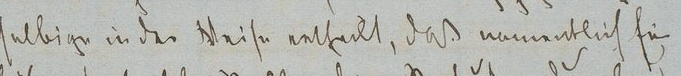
selbige in der Weise ertheilt, daß namentlich für
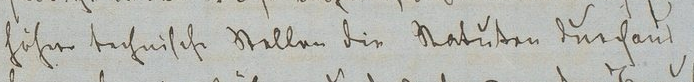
höhere technische Stellen die Statuten durchaus
